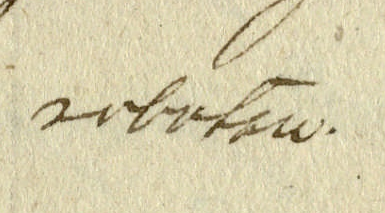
erboten.
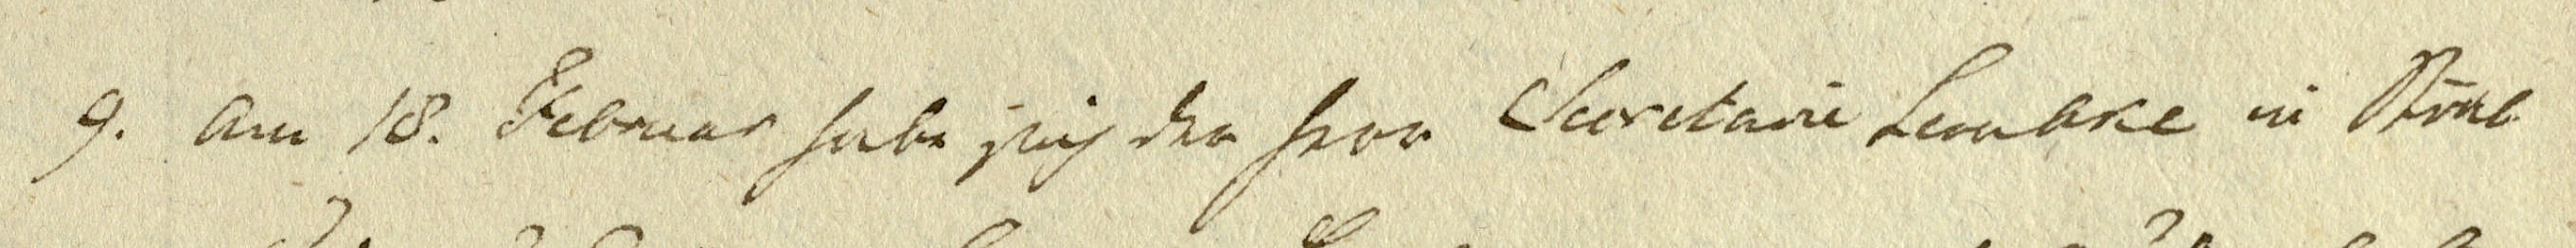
9. Am 18. Februar habe sich der Herr Secretarie Lembke in Stral¬
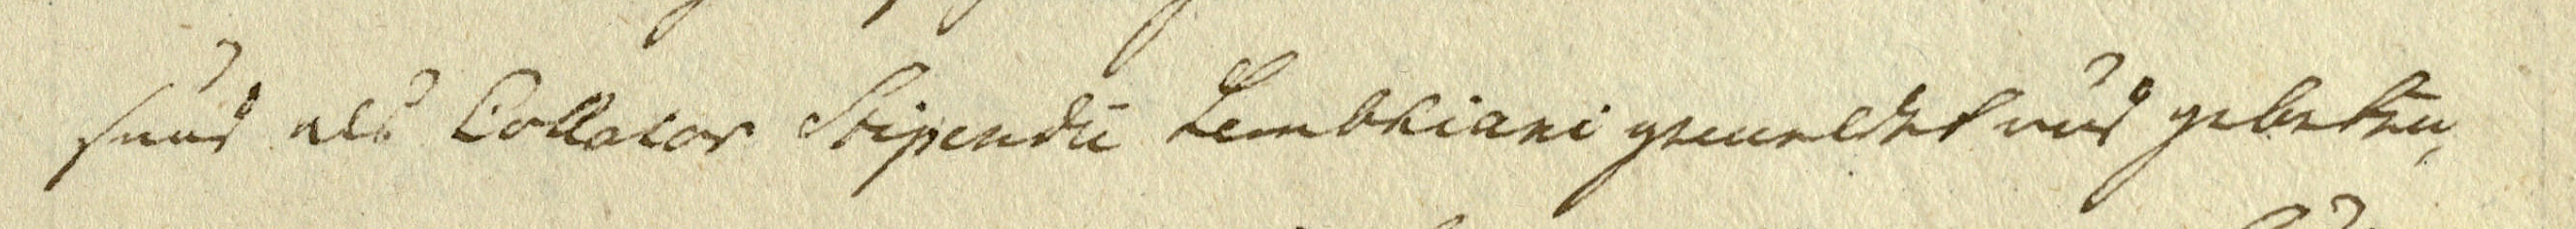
sund als Collator Stipendii Lembkiani gemeldet und gebeten,
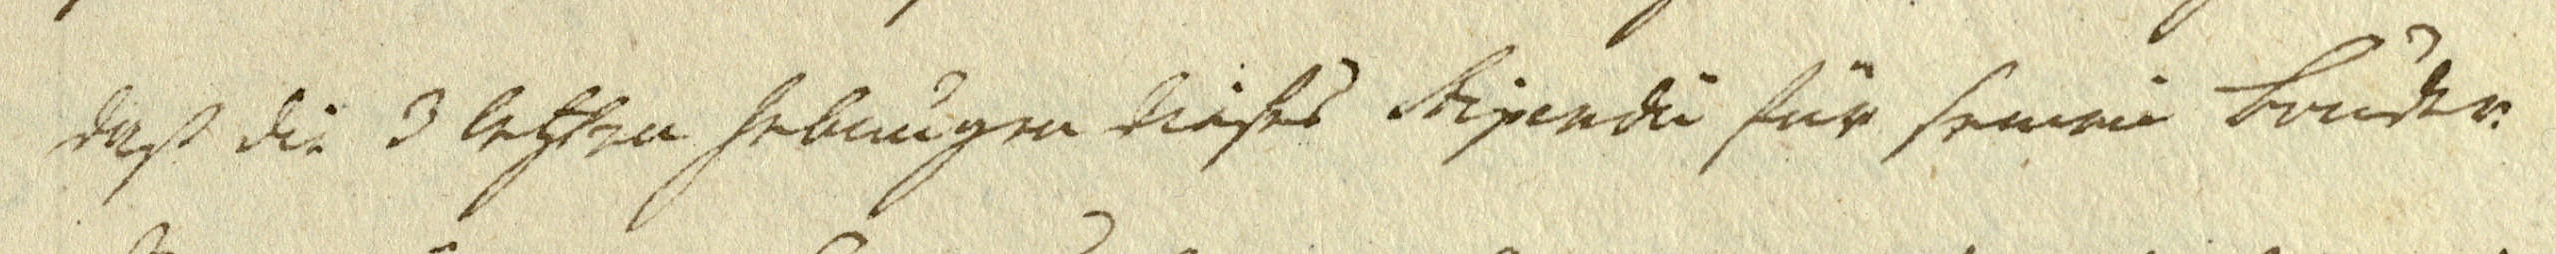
daß die 3 letzten Hebungen dieses Stipendii für seinen Bruder¬
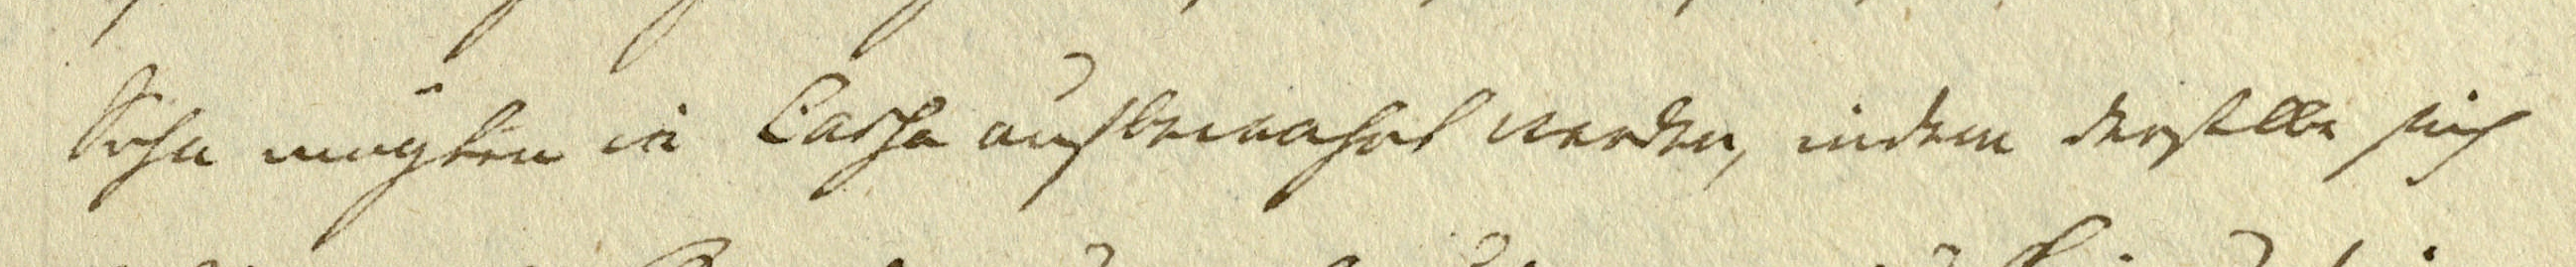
Sohn mögten in Cassa ausbewahrt werden, indem derselbe sich
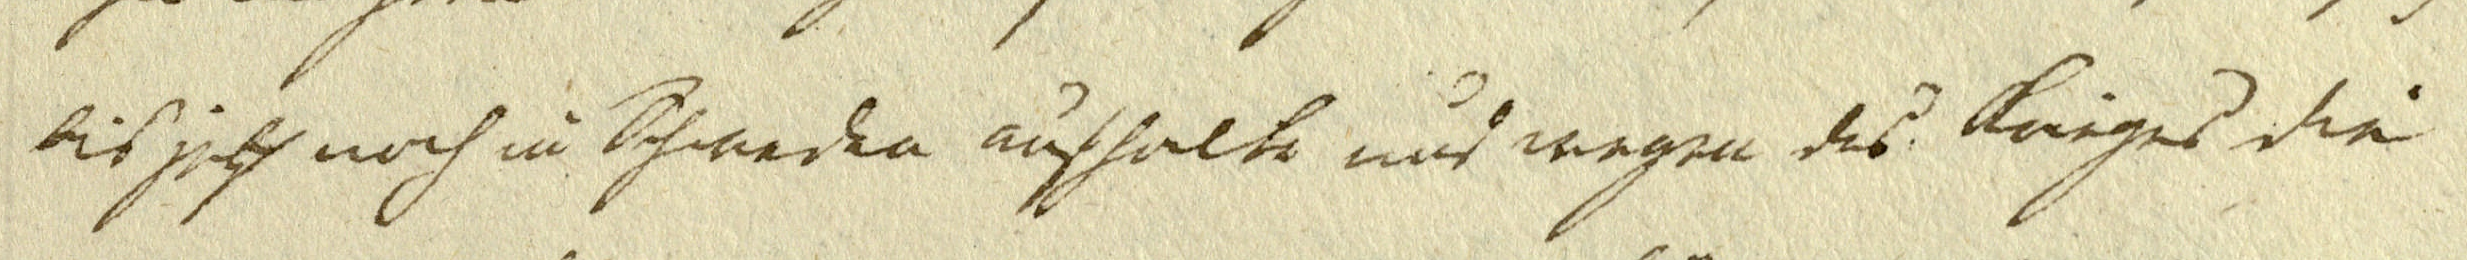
bis jetzt noch in Schweden aufhalte und wegen des Krieges die
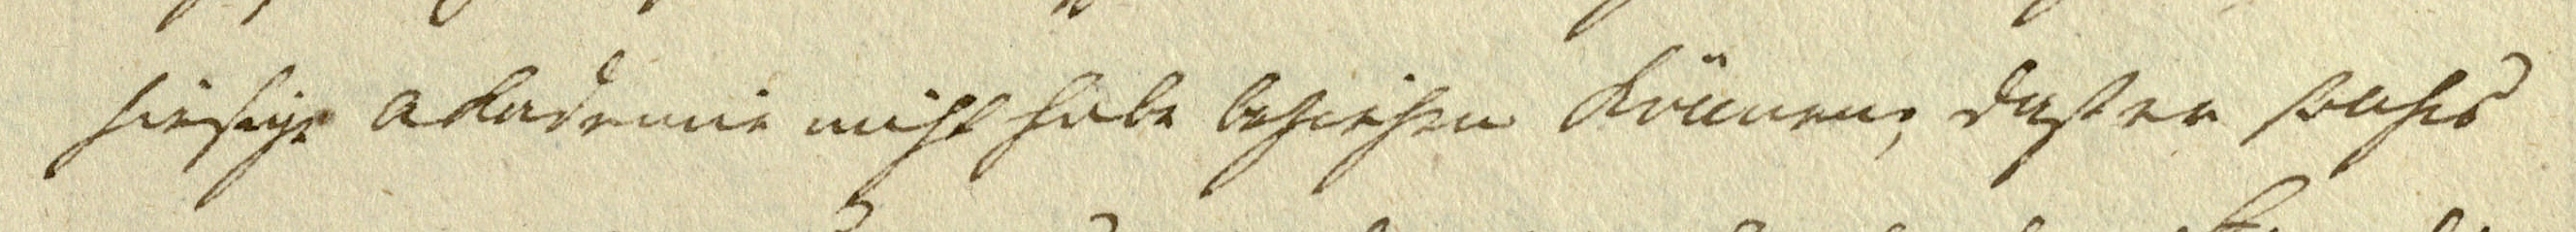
hiesige Akademie nicht habe beziehen können, daß er solches
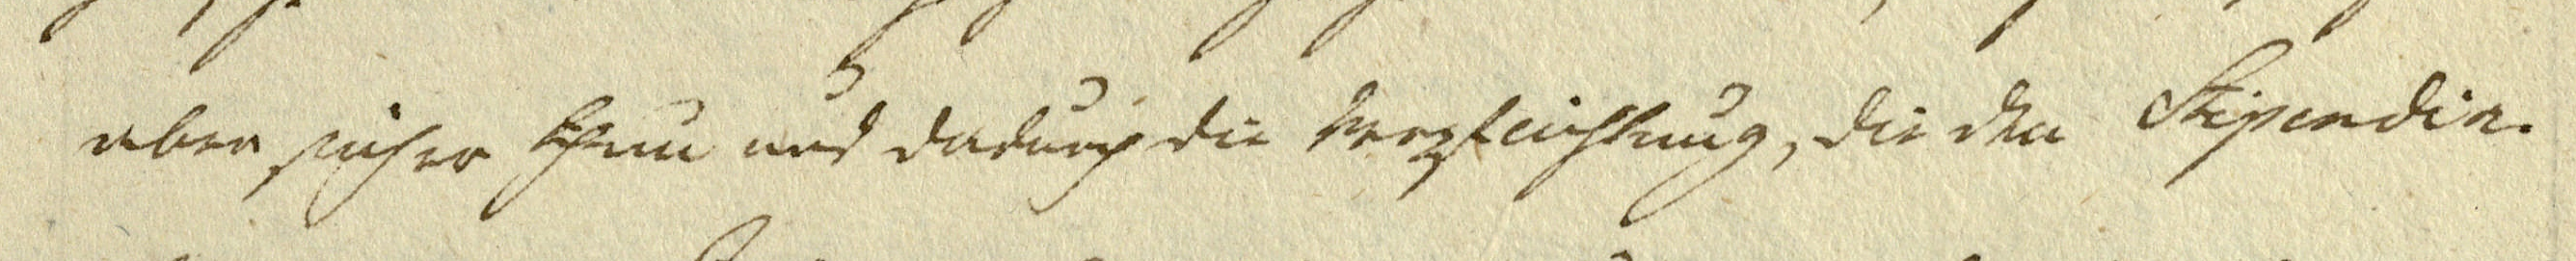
aber sicher thun und dadurch die Verpflichtung, die den Stipendia¬
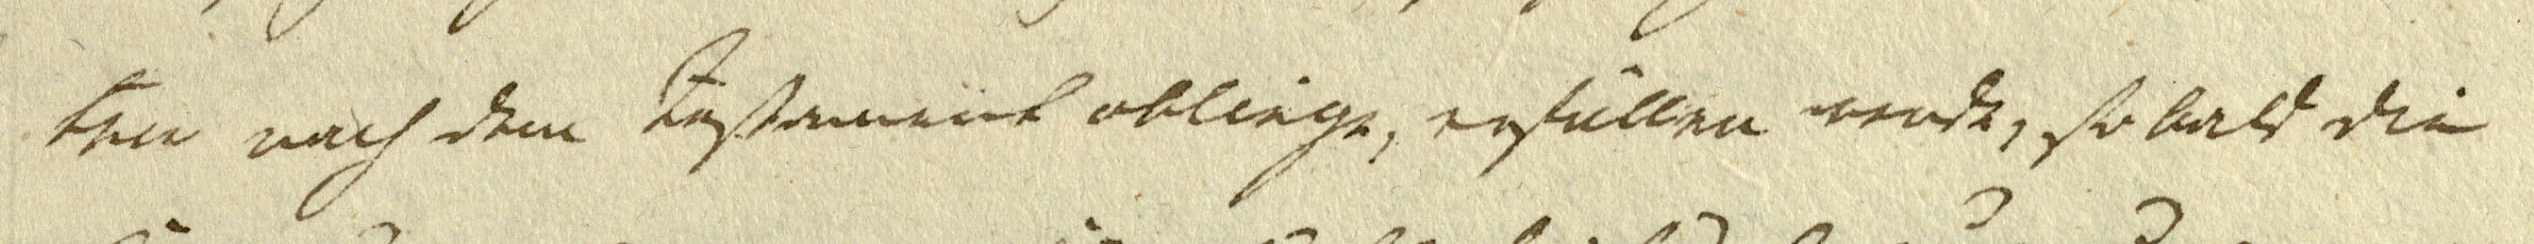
ten nach dem Testament obliege, erfüllen werde, so bald die
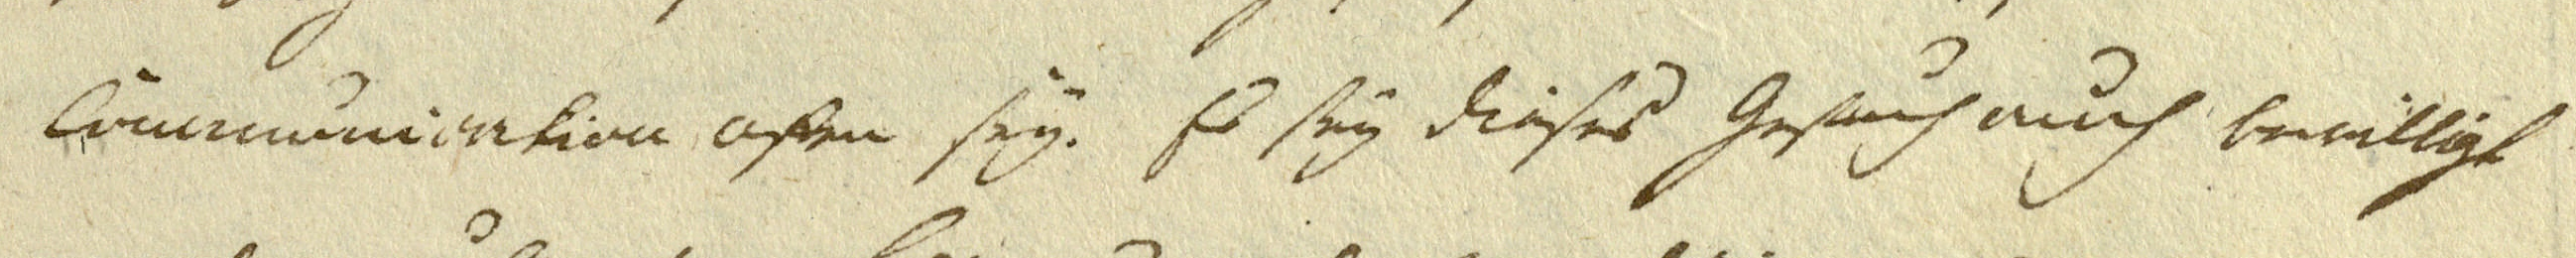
Communication offen seÿ. Es seÿ dieses Gesuch auch bewilligt
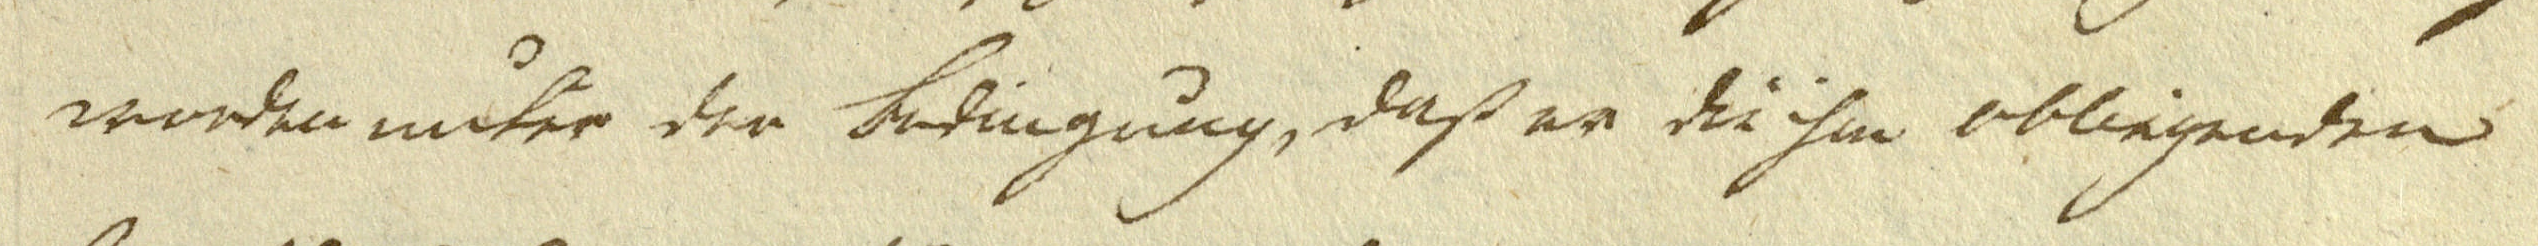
worden unter der Bedingung, daß er die ihm obliegenden
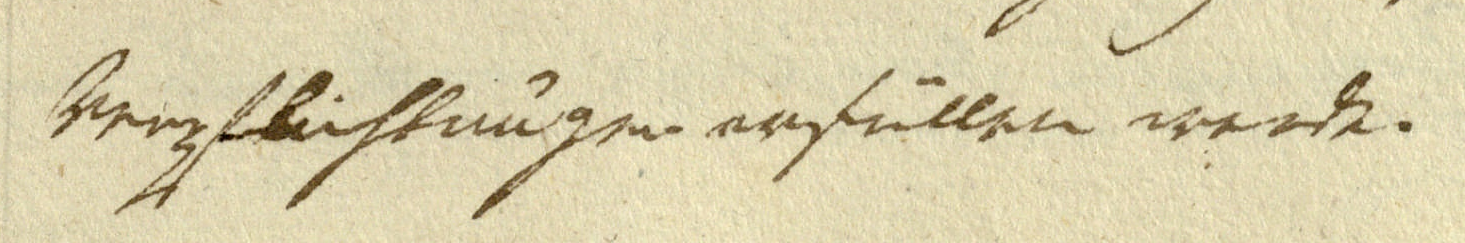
Verpflichtungen erfüllen werde.
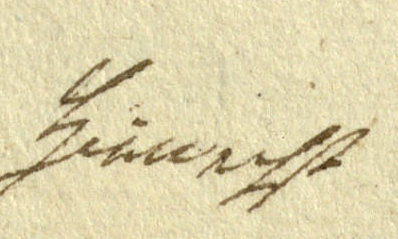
Hienechst
